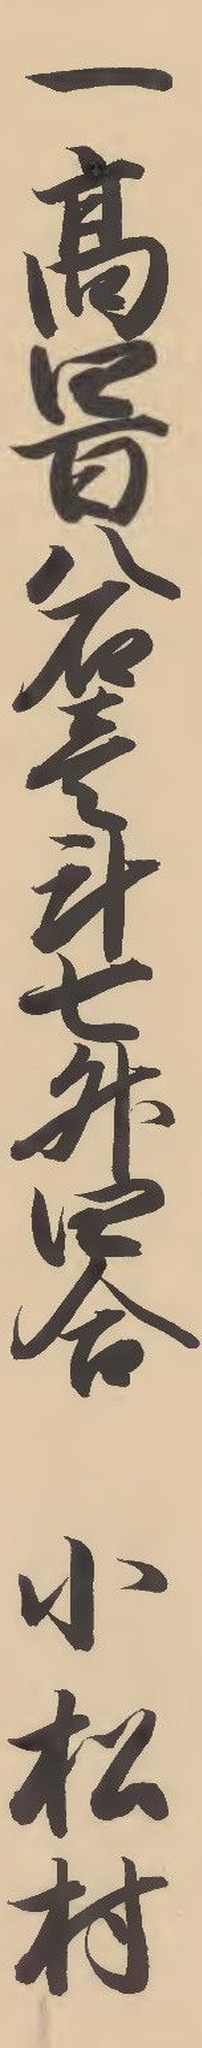一高四百八石壱斗七升四合小松村
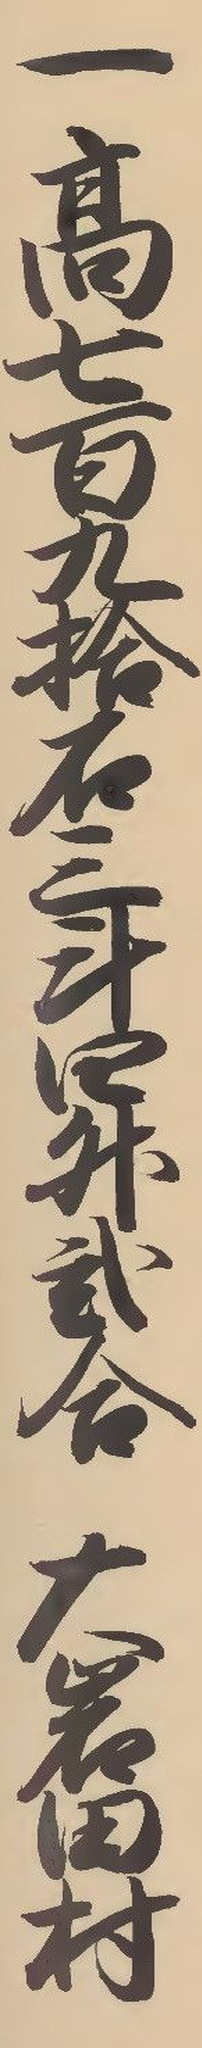一高七百九拾石三斗四升弐合大岩田村
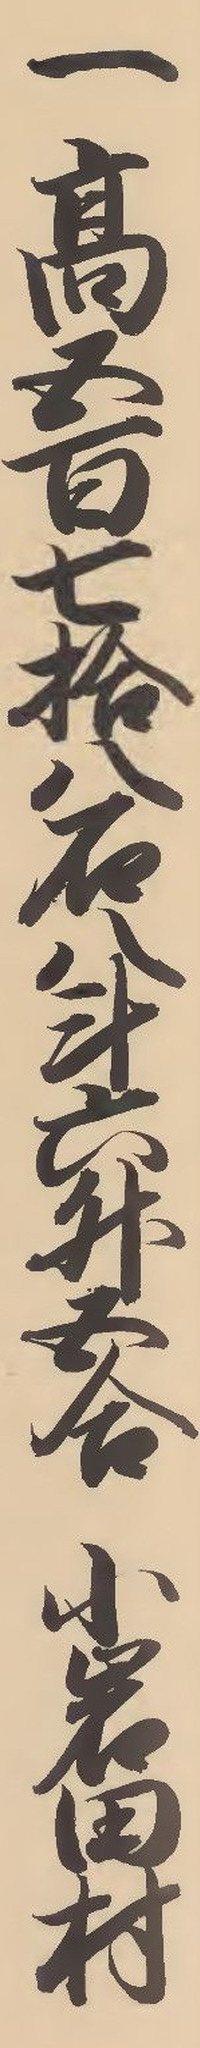一高五百七拾八石八斗六升五合小岩田村
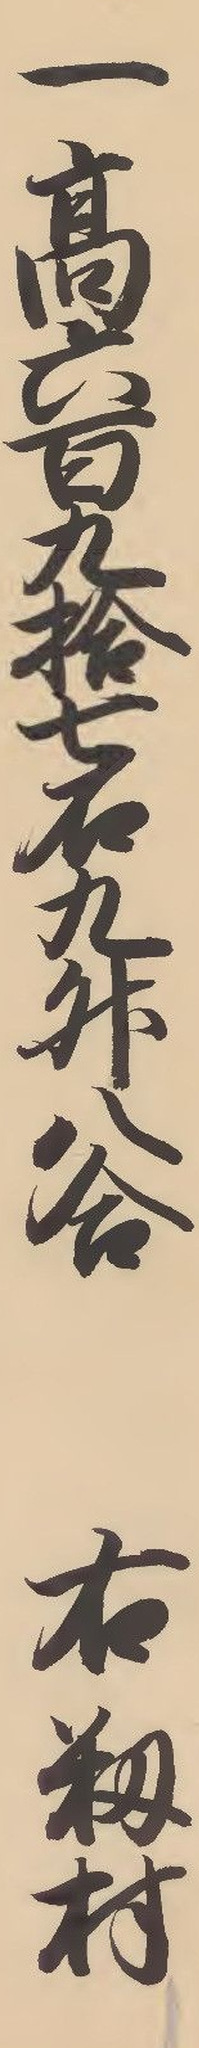一高六百九拾七石九升八合右籾村
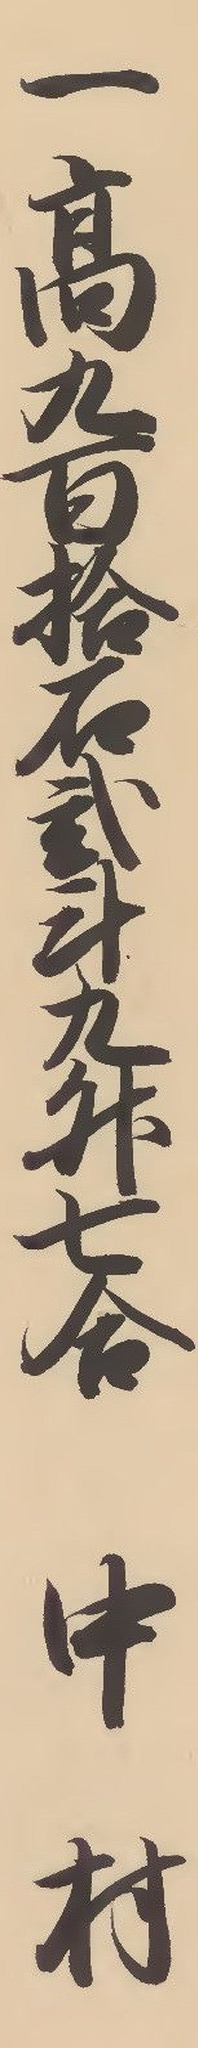一高九百拾石弐斗九升七合中村
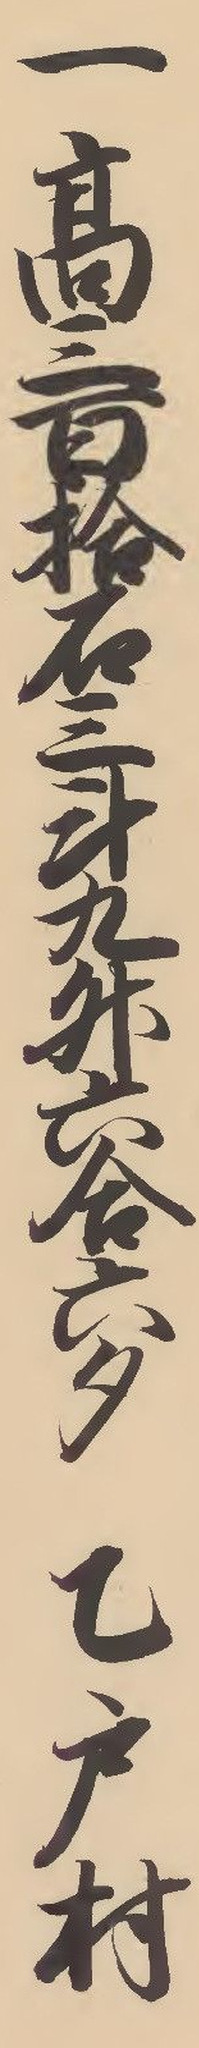一高三百拾石三斗九升六合六勺乙戸村

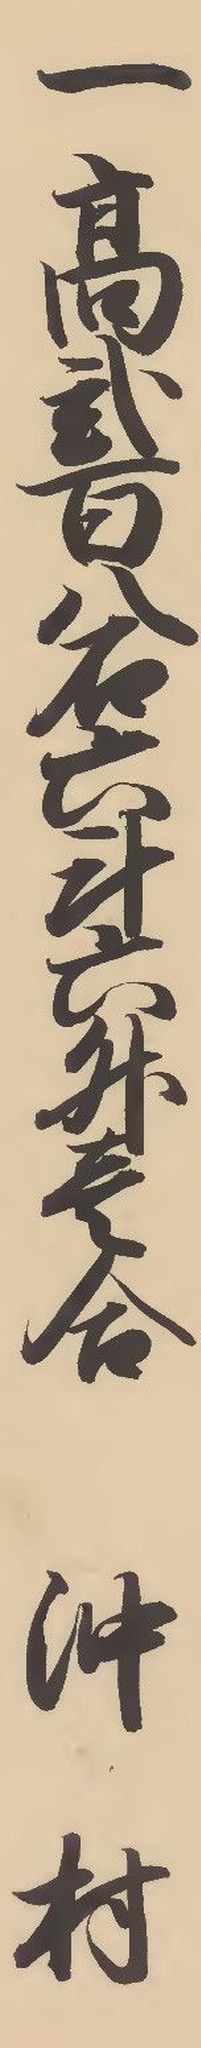一高弐百八石六斗六升壱合沖村
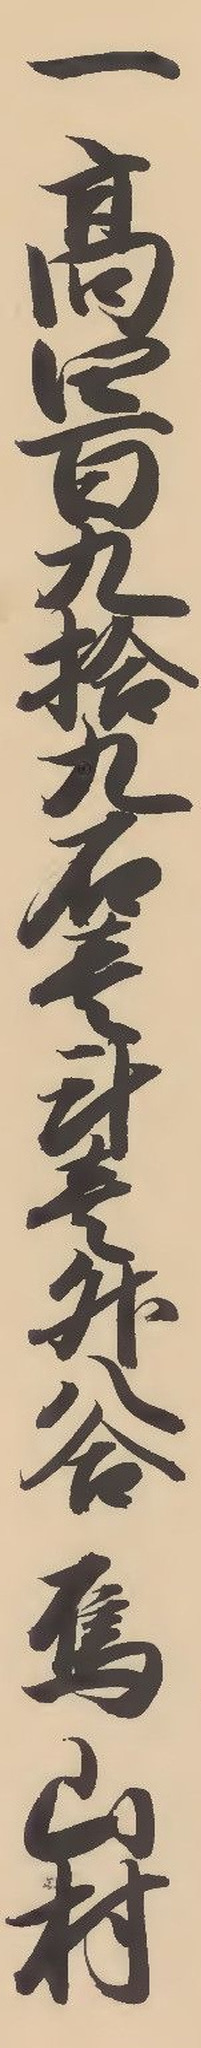一高四百九拾九石壱斗壱升八合烏山村
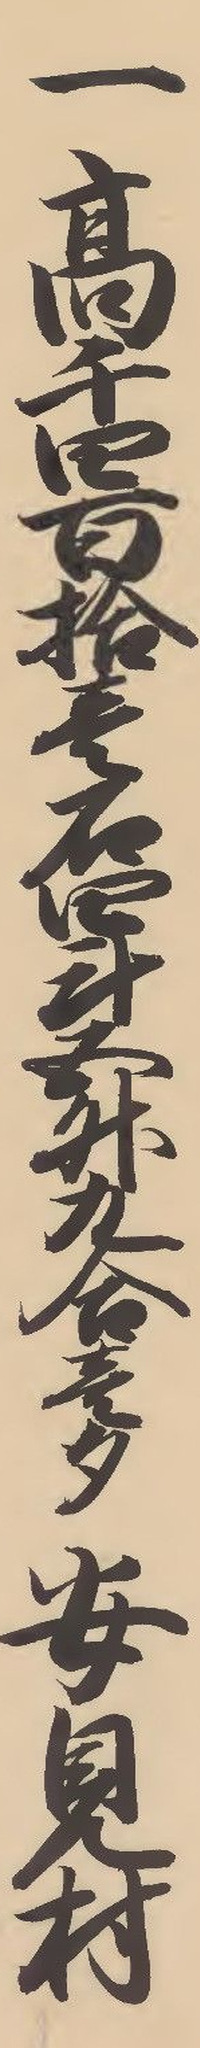一高千四百拾壱石四斗五升九合壱勺安見村
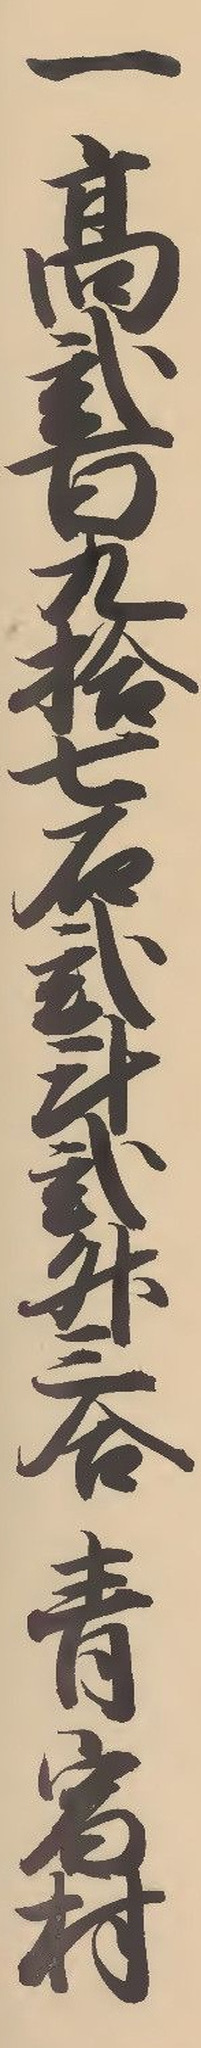一高弐百九拾七石弐斗弐升三合青宿村
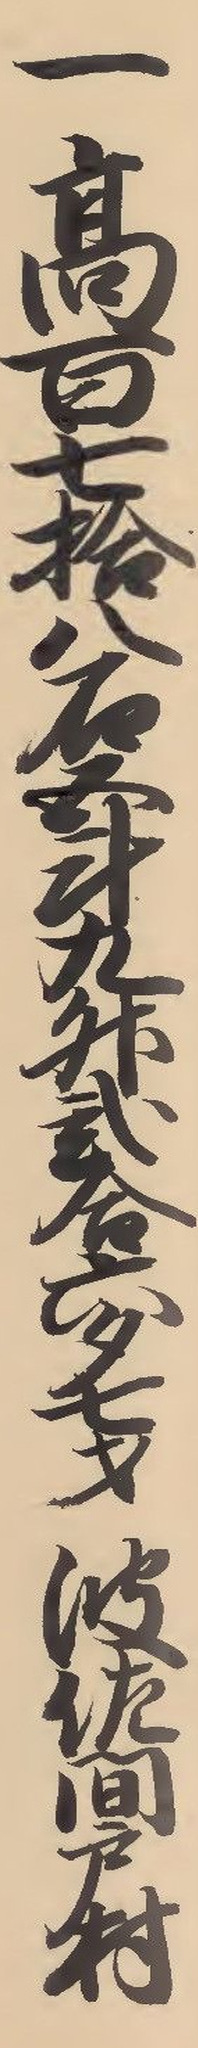一高百七拾八石五斗九升弐合六勺七才波佐間戸村
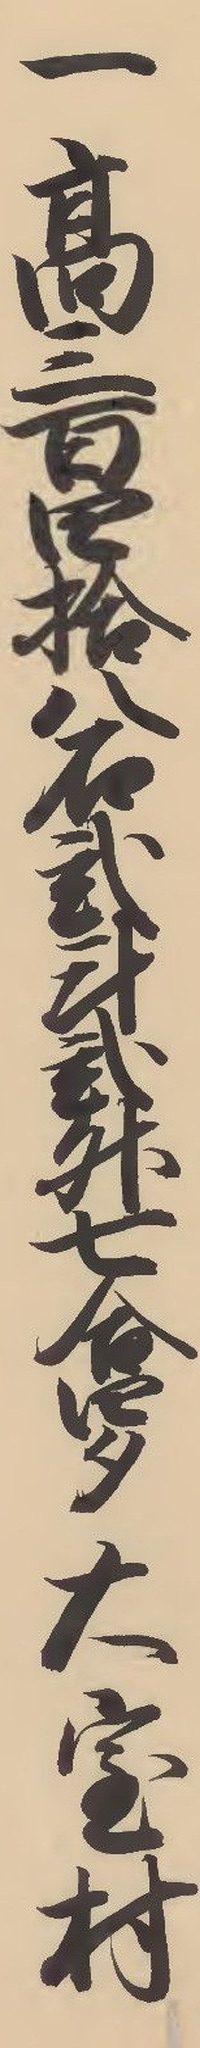一高三百四拾八石弐斗弐升七合四勺大室村
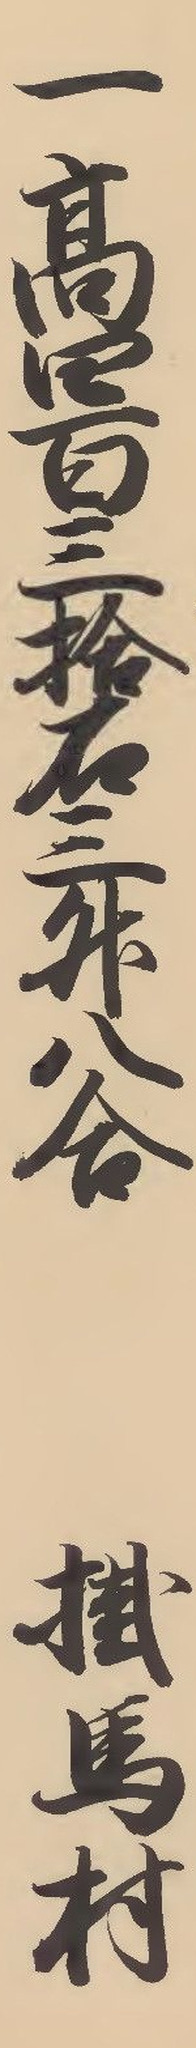一高四百三拾石三升八合掛馬村
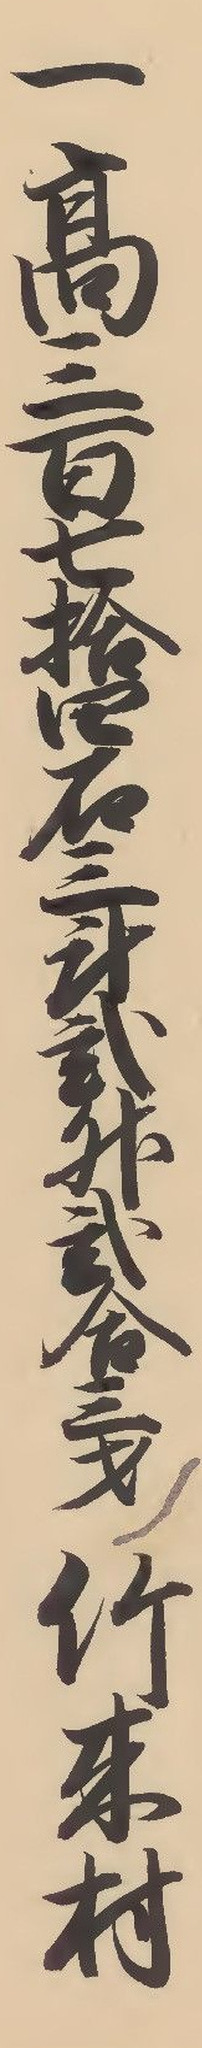一高三百七拾四石三斗弐升弐合三才竹来村

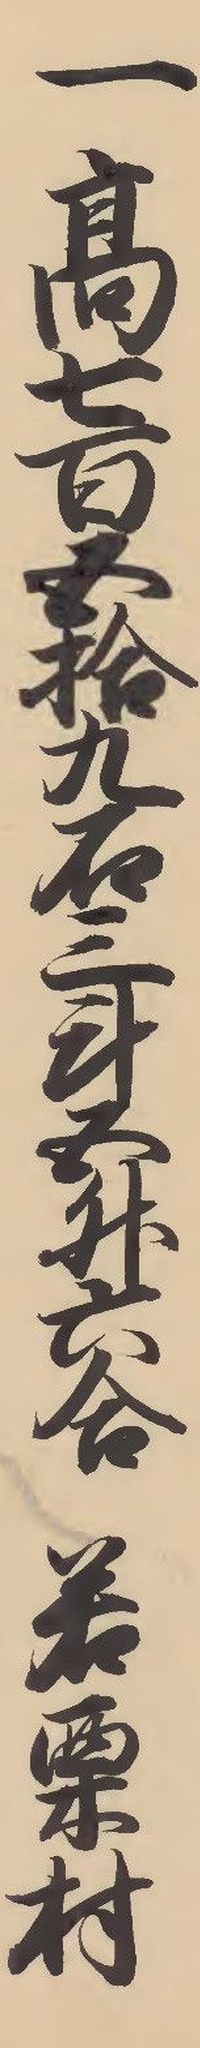一高七百五拾九石三斗五升六合若栗村
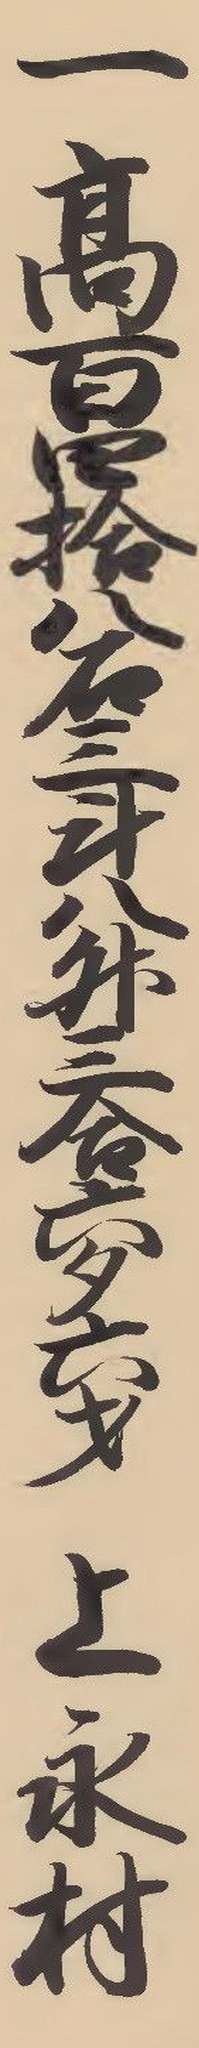一高百四拾八石三斗八升三合六勺六才上永村
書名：常陸国郷帳
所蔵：国立公文書館 National Archives of Japan
